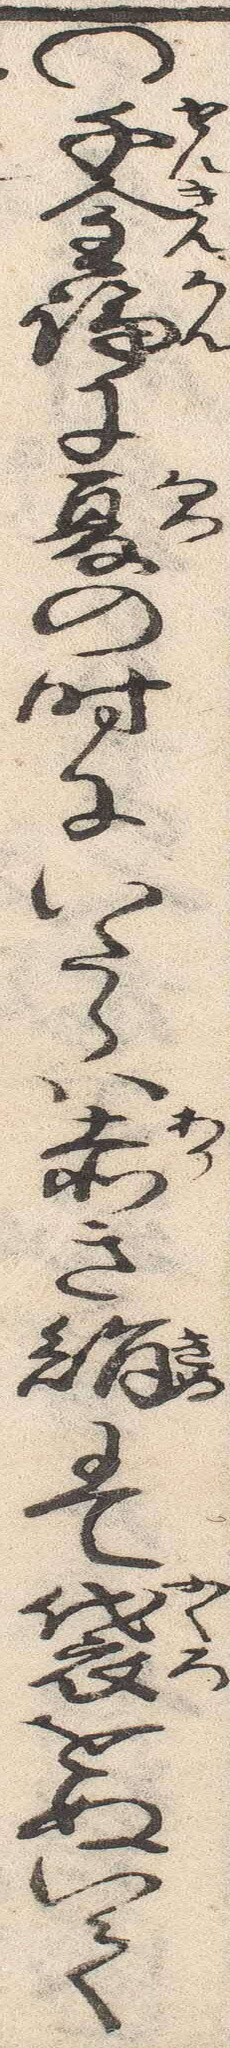◯千金論に夏の時にいたらは赤き絹にて袋をぬいて
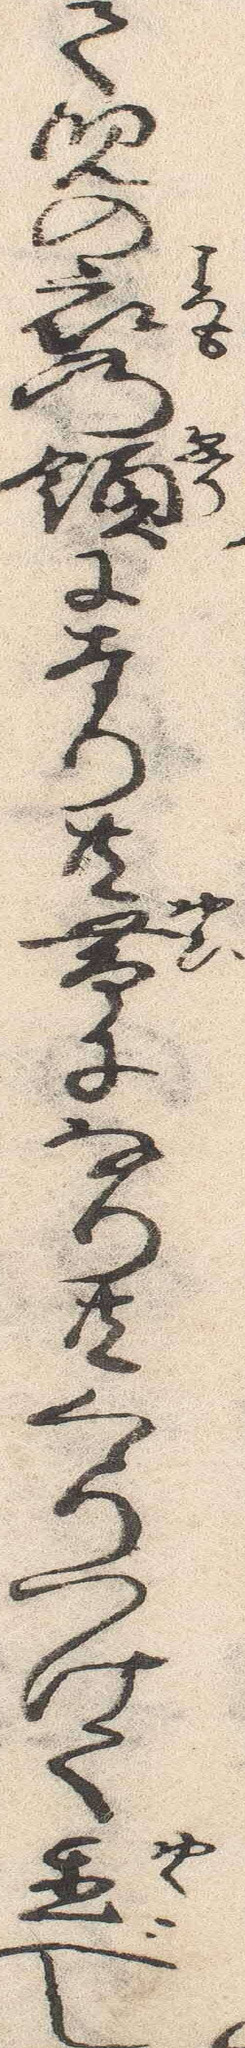て児の衣の領になり共帯になり共くゝりつけて置べし
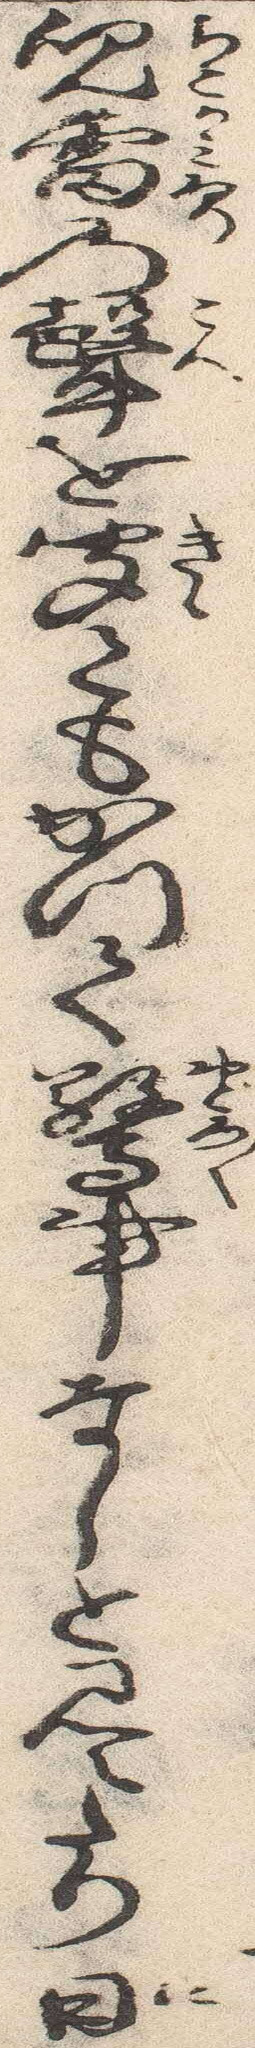児雷の聲を聞てもかつて驚事なしと見へたり日
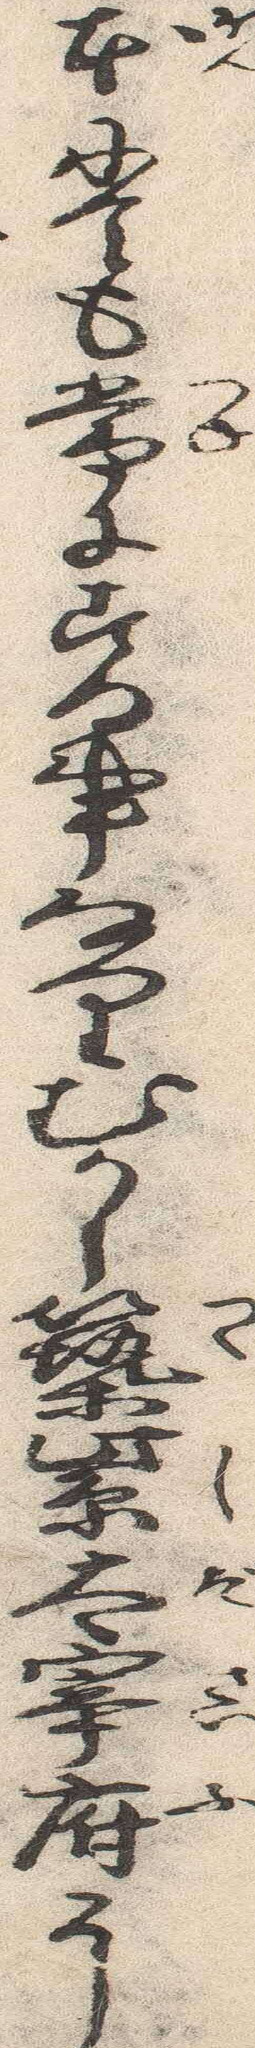本にても常にする事なりむかし築紫太宰府に
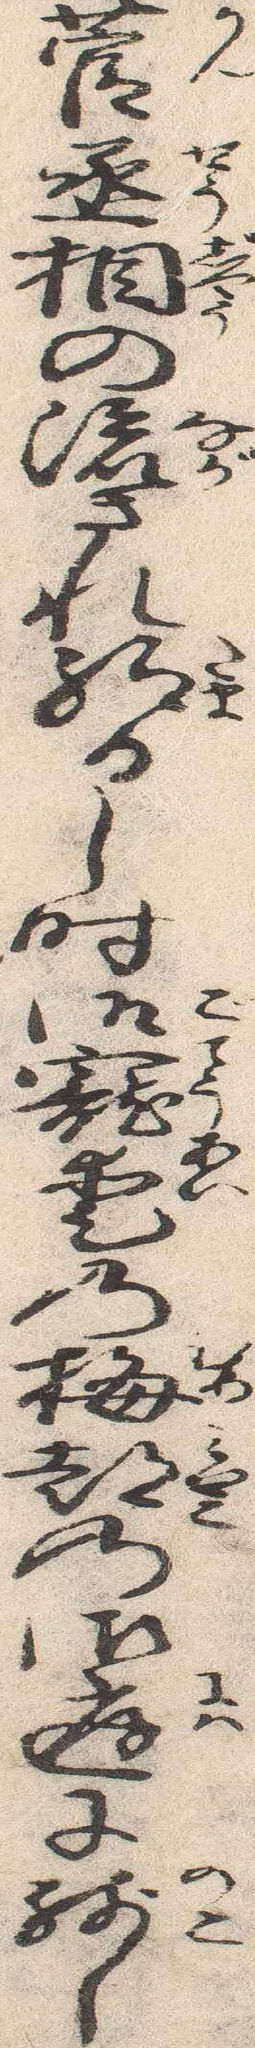菅丞相の流され給ひし時御寵愛の梅都の御庭に残し
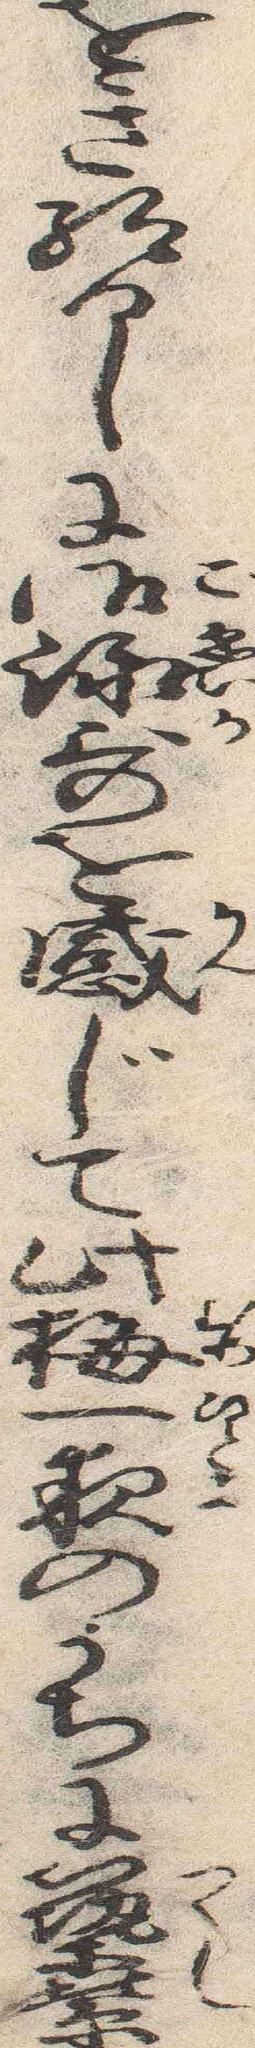をき給ひしに御詠哥を感じて此梅一夜のうちに築紫
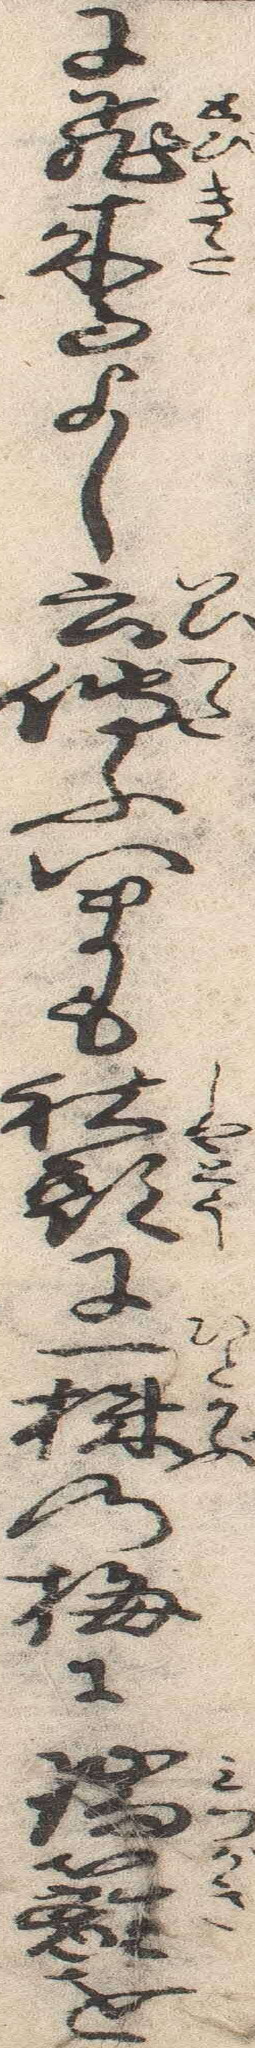に飛來るよし云傳ふいまも社頭に一株の梅に瑞籬を
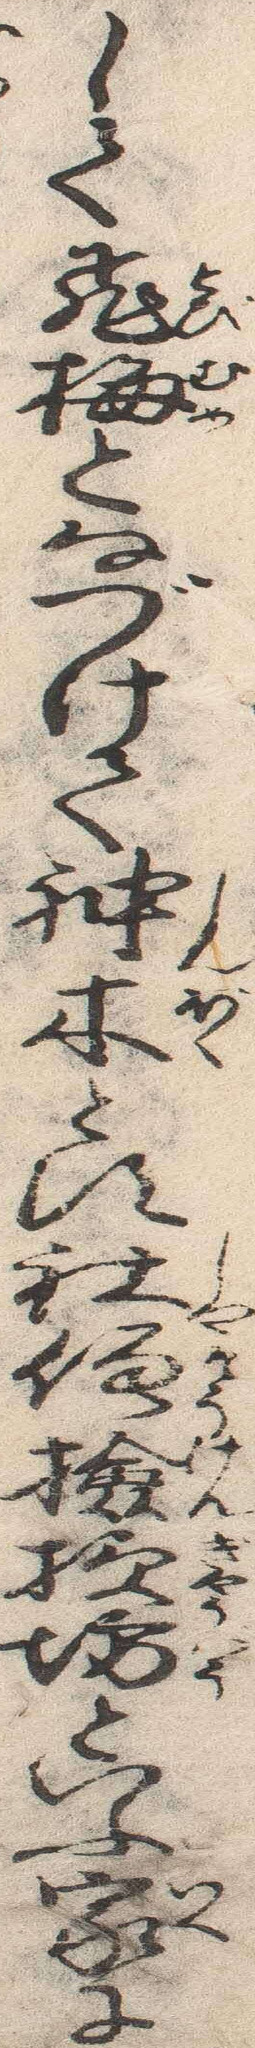して飛梅となづけて神木とす社僧検校坊といふ家に
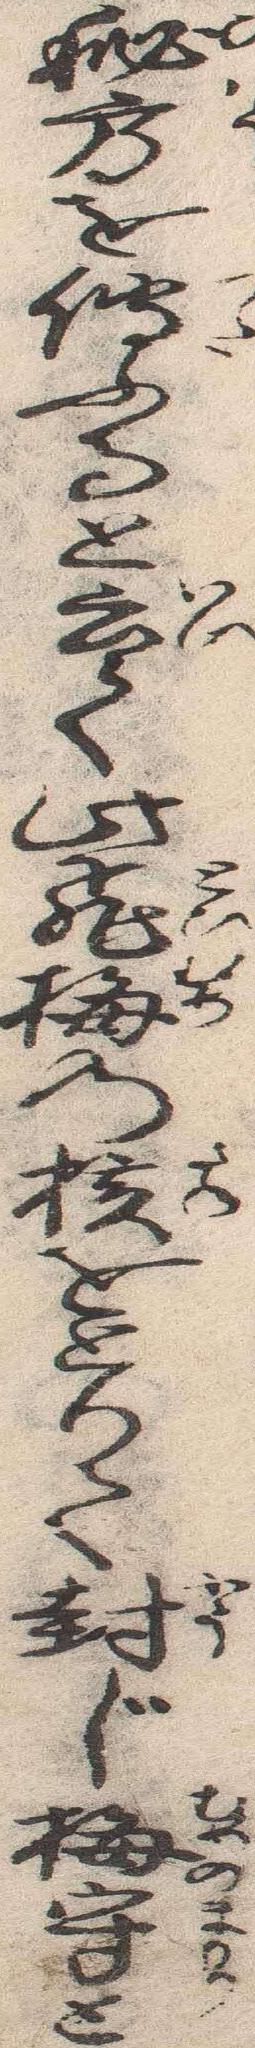秘方を傳ふると云て此飛梅の核をとりて封じ梅守と
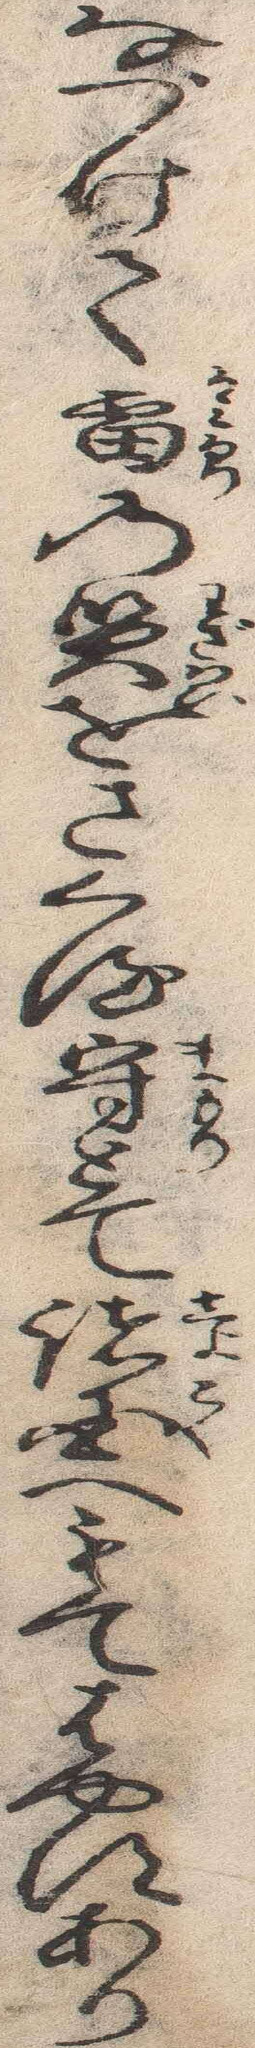なづけて雷の災をさくる守とて諸國へもてはやすあり

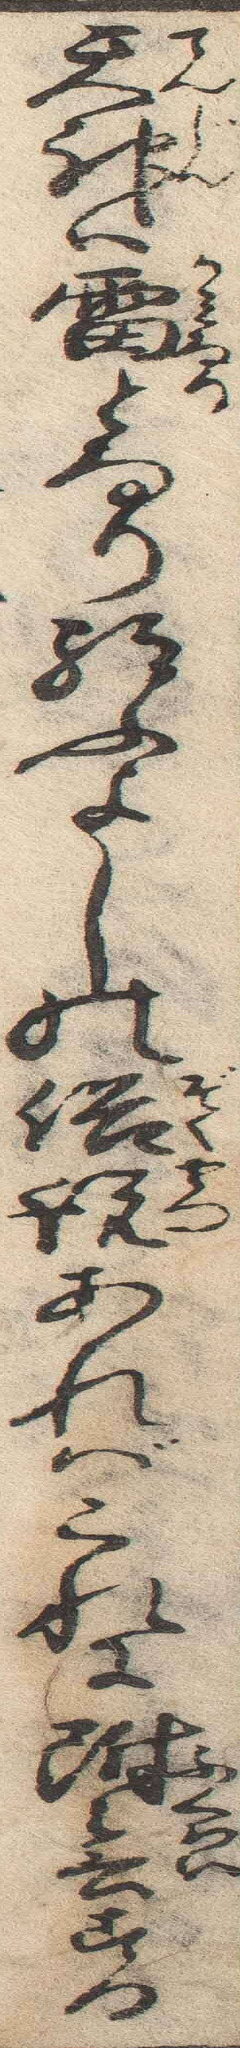天神は雷となり給ふよしの俗説あればこれに附会する
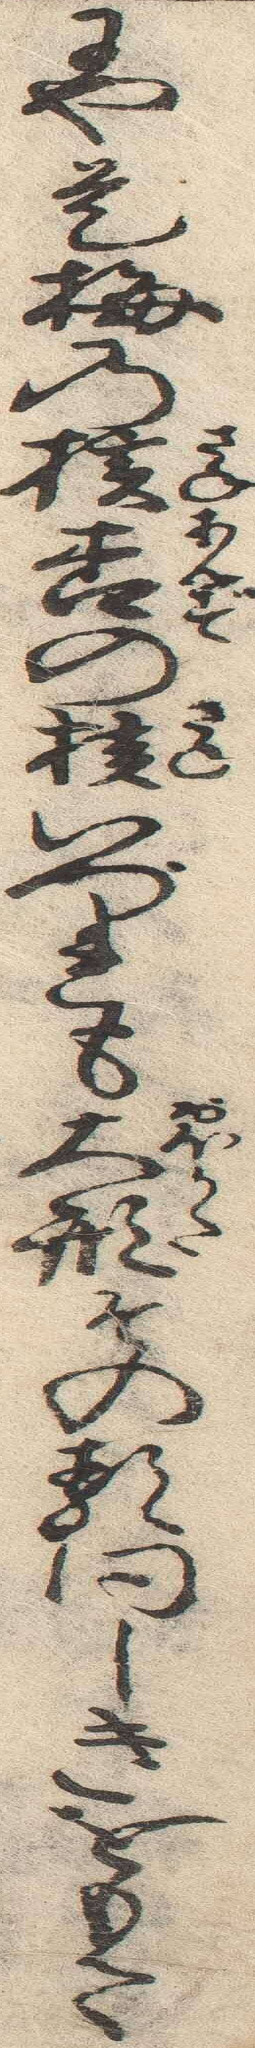にや是梅の核杏の核いづれも大形その類同しきをもて
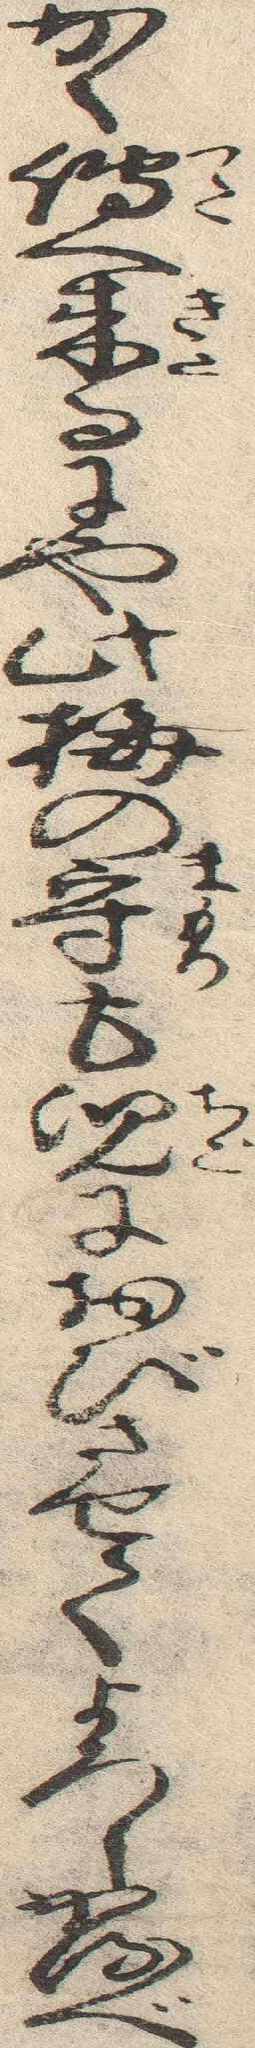かく傳へ來るにや此梅の守も児におびさせてよろしかるべ
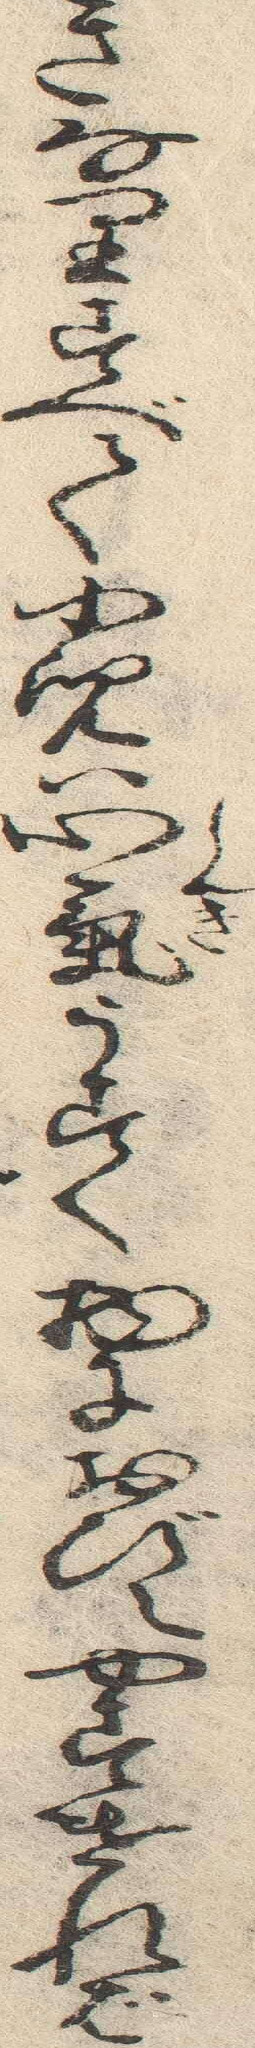きなりすべて小児は心氣うすく物におびえやすければ
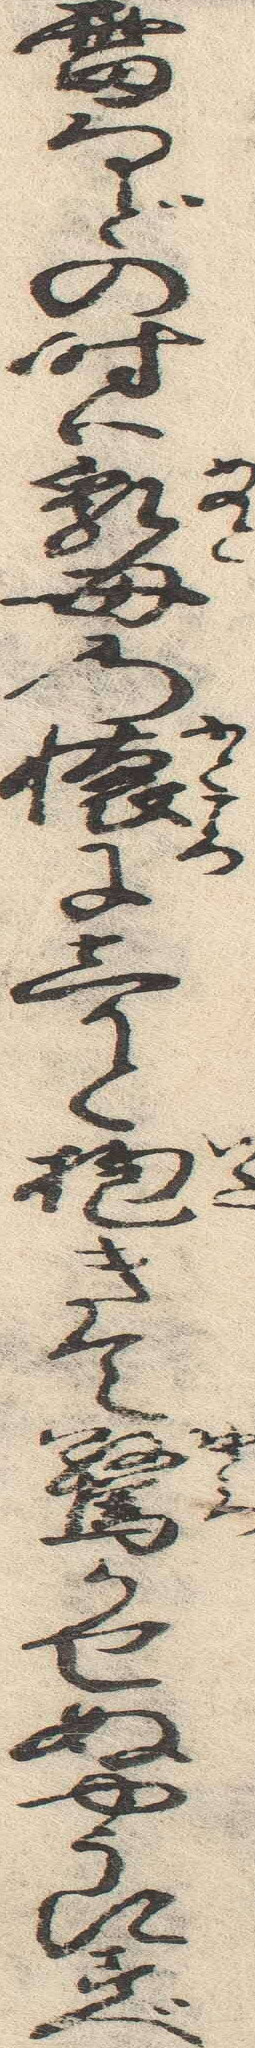雷などの時は乳母の懐にしかと抱きて驚かせぬやうにすべ
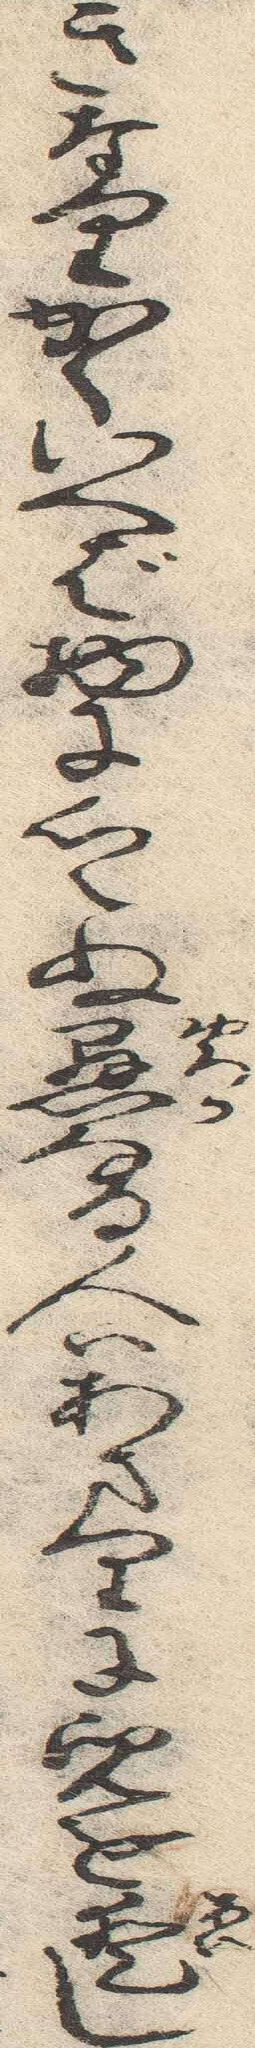きなりかくいへば物に心えぬ愚なる人はあまりに児を愛し
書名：小児必用養育草
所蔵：東京学芸大学附属図書館 国文学研究資料館
